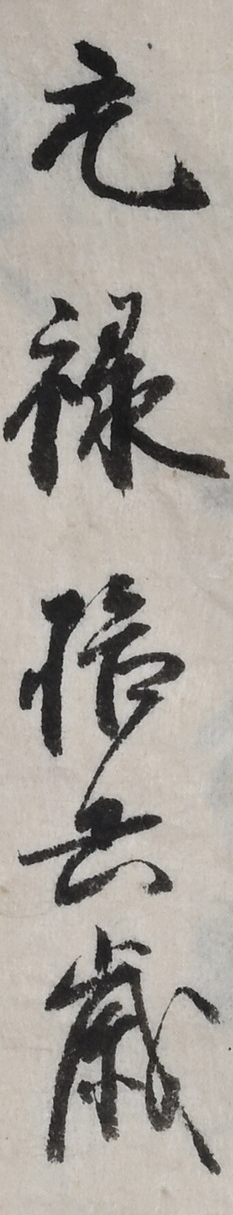元禄拾六歳

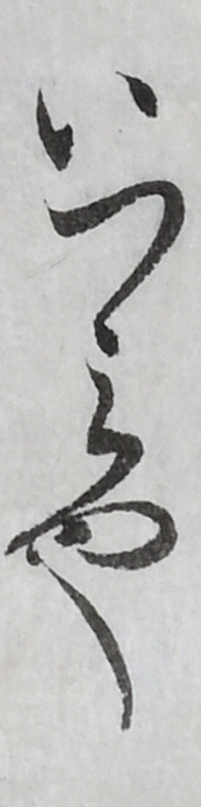いつミや
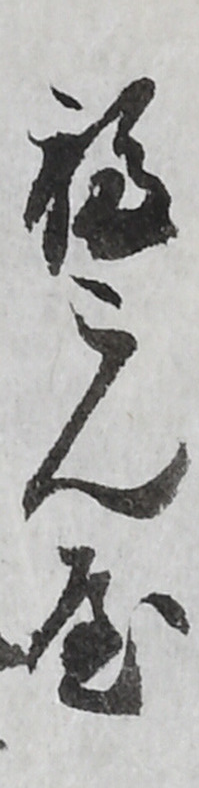福こん屋
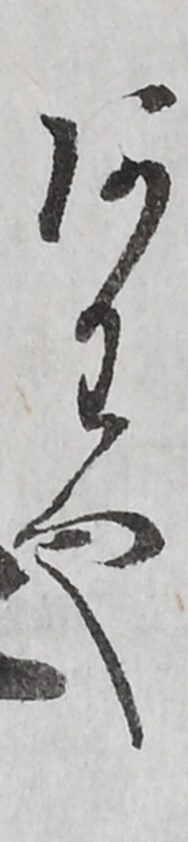あわや
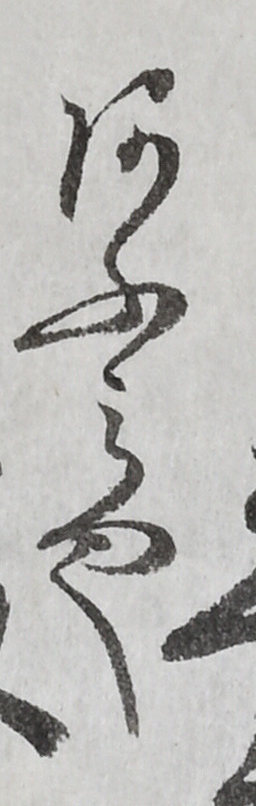あふミや
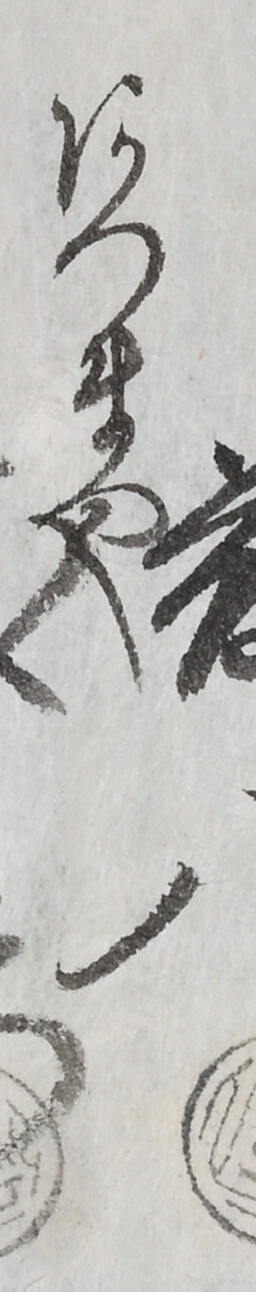あつまや
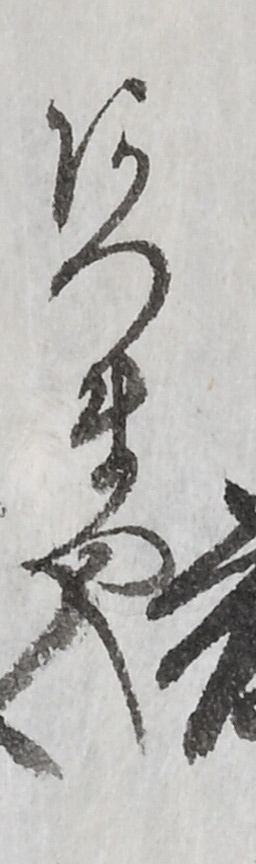あつまや
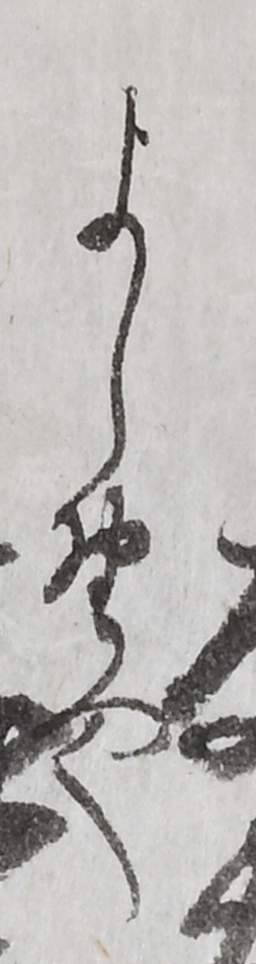よしのや
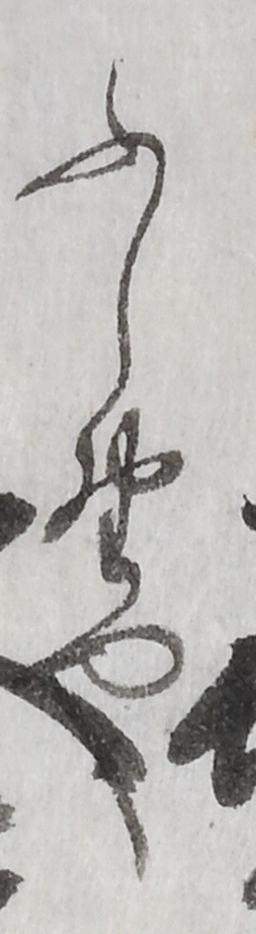ふしのや
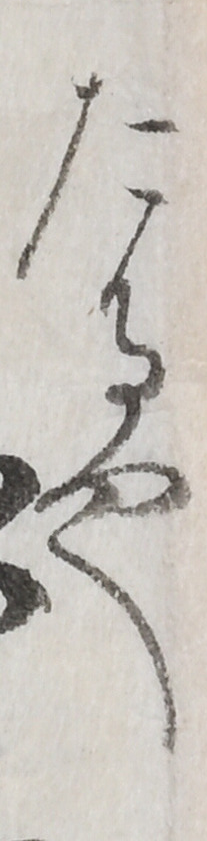あるや
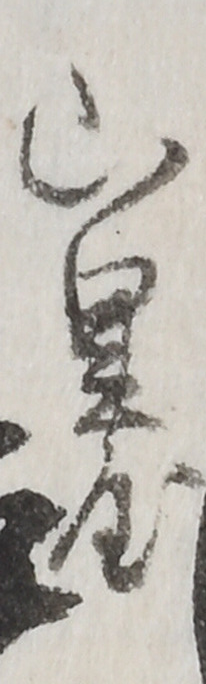山里屋
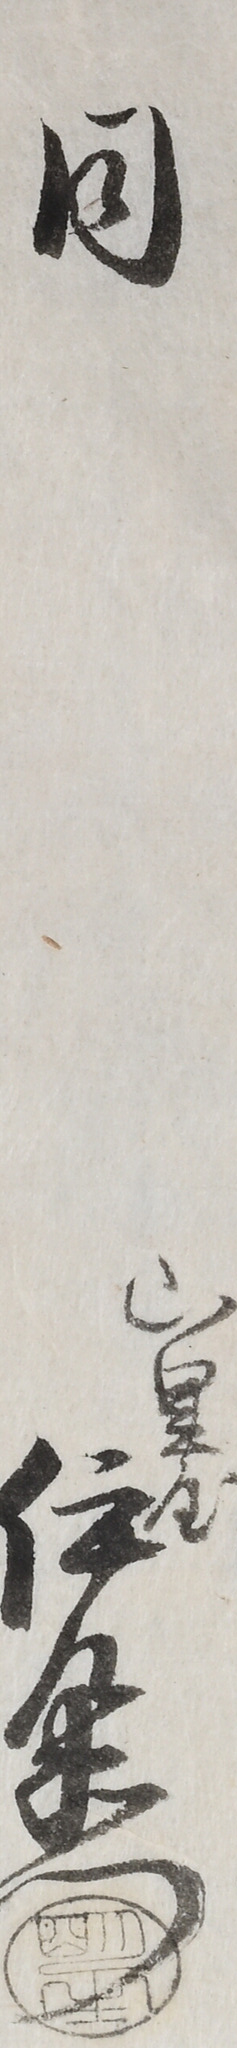同伊左衛門㊞
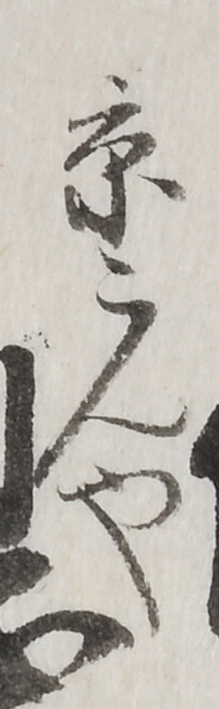京こんや
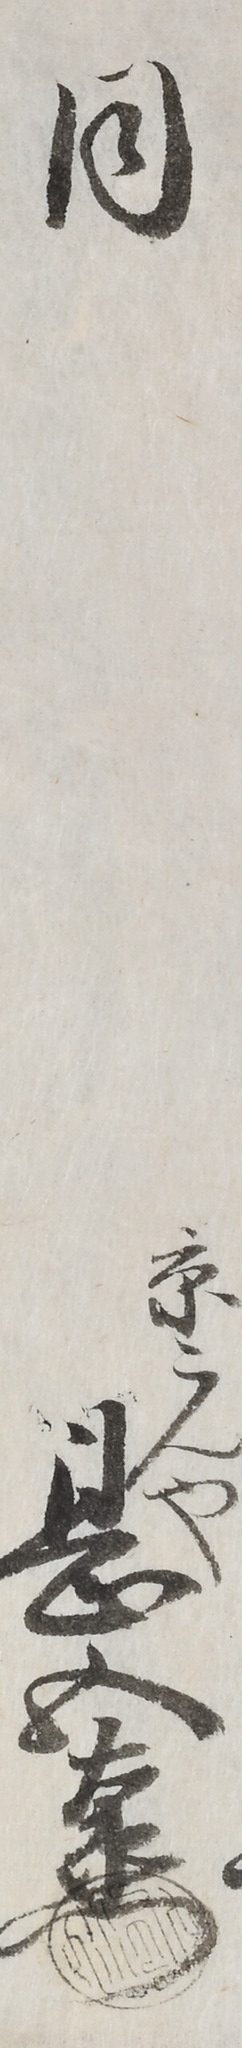同甚五右衛門㊞
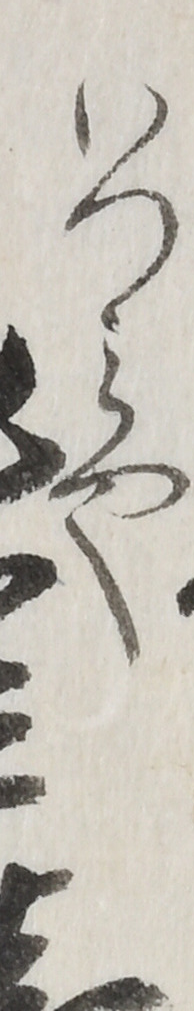いつミや
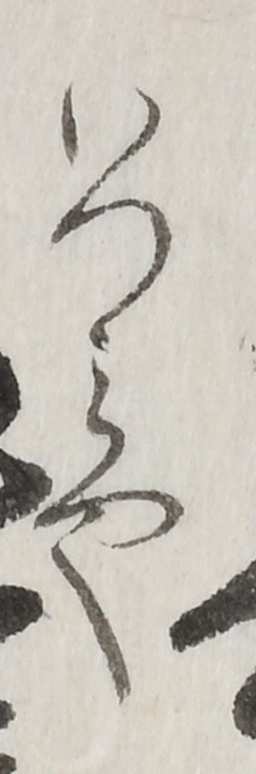いつミや
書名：當町火消道具幷役付帳
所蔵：伊那市立高遠町図書館・合同会社AMANE
